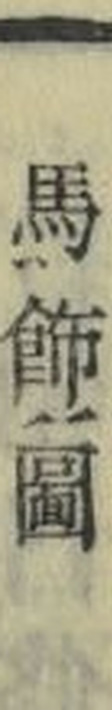馬飾図

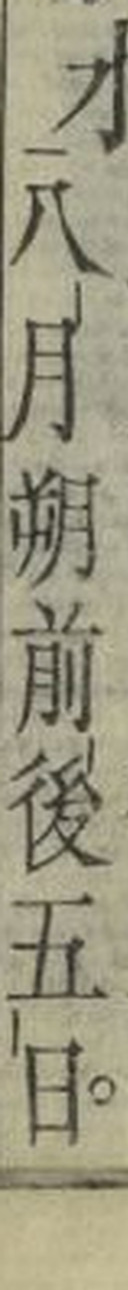八-月朔前-後五-日。

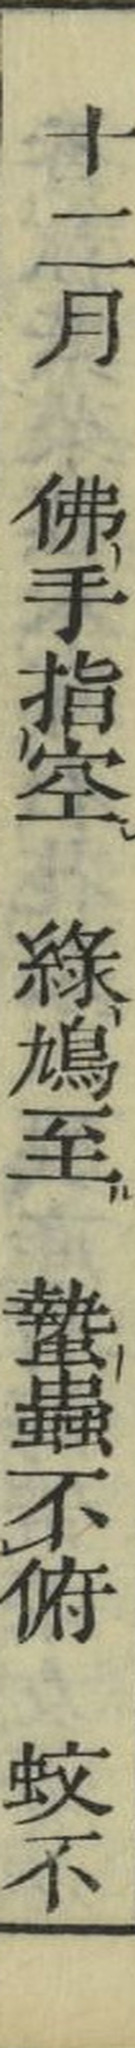十二月仏-手指-空緑-鳩至蟄-虫不俯蚊不

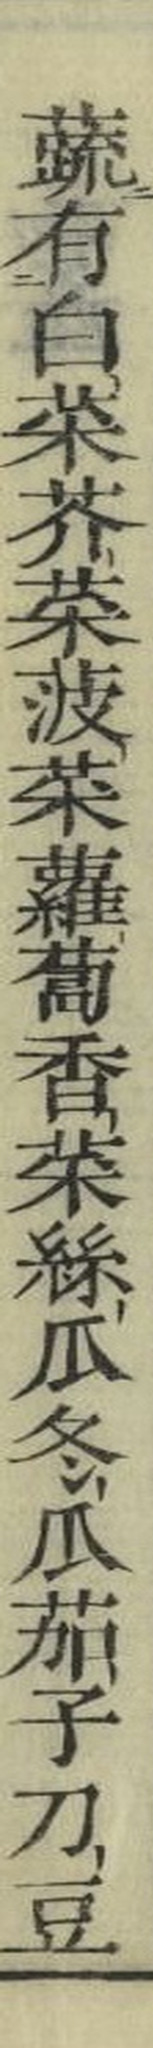蔬有白-菜芥-菜菠-菜蘿-蔔香-菜糸-瓜冬-瓜茄-子刀-豆
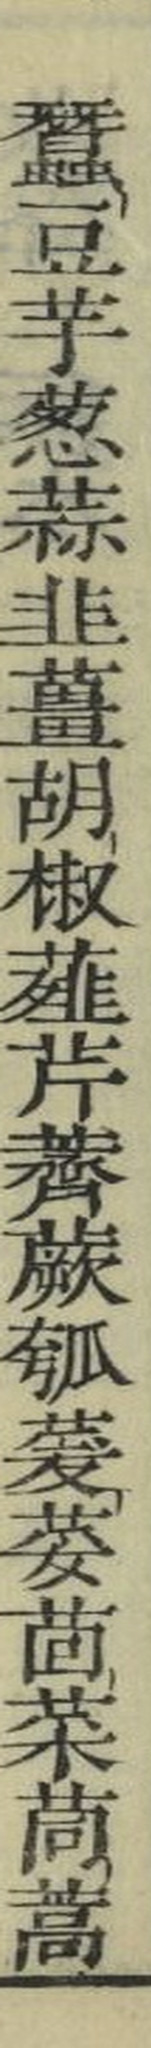蚕-豆芋葱蒜韭薑胡-椒薤芹薺蕨瓠萲-荽茴-菜茼-蒿
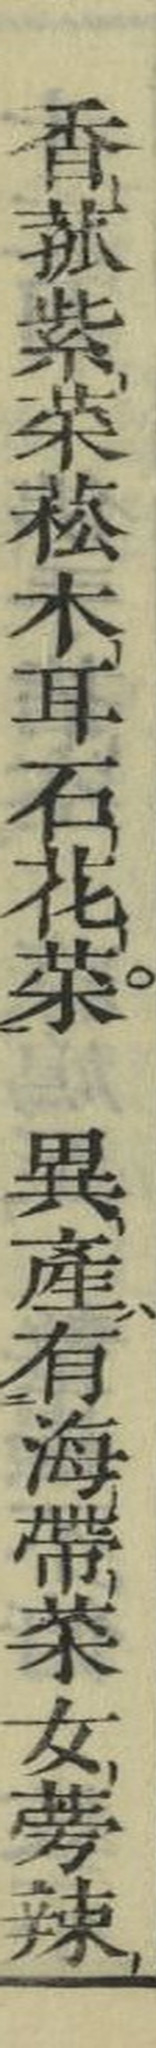香-菰紫-菜菘木-耳石-花-菜。異-産有海-帯-菜女-蒡辣-

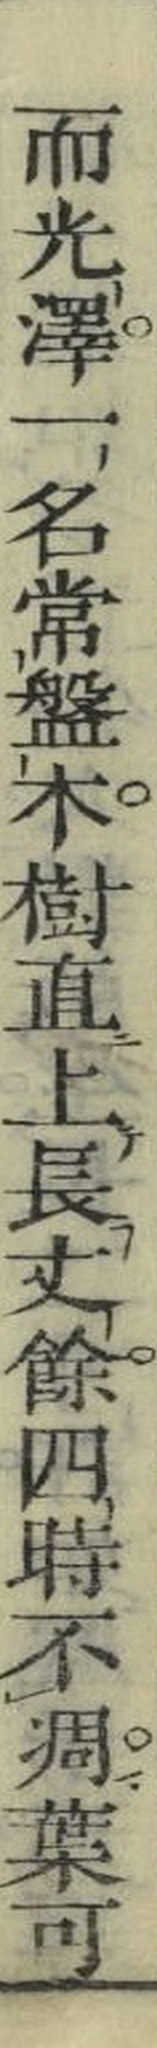而光-沢。一-名常-盤-木。樹直上長ヿ丈-余。四-時不凋。葉可

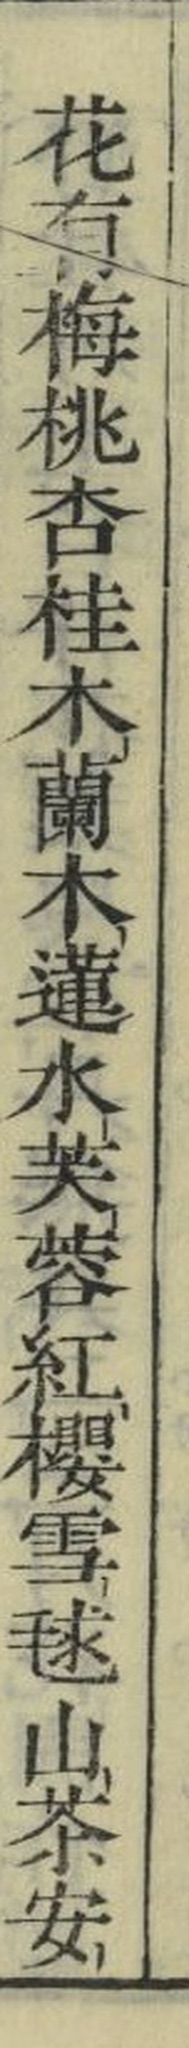花有梅桃杏桂木-蘭木-蓮水-芙-蓉紅-桜雪-毬山-茶安-
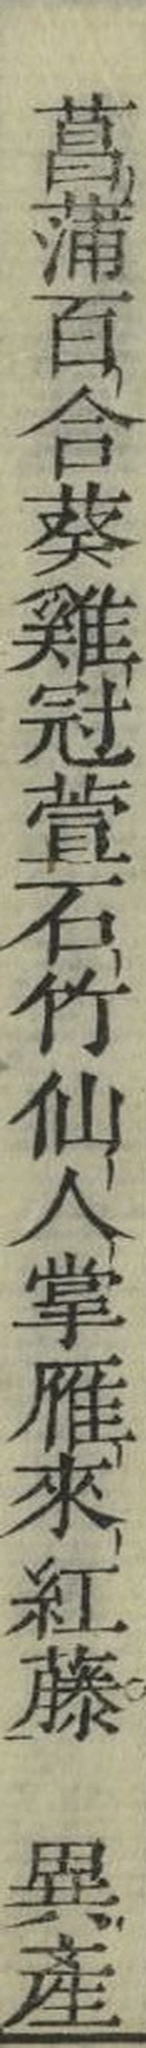菖-蒲百-合葵鶏-冠萱石-竹仙-人-掌雁-来-紅藤。異-産

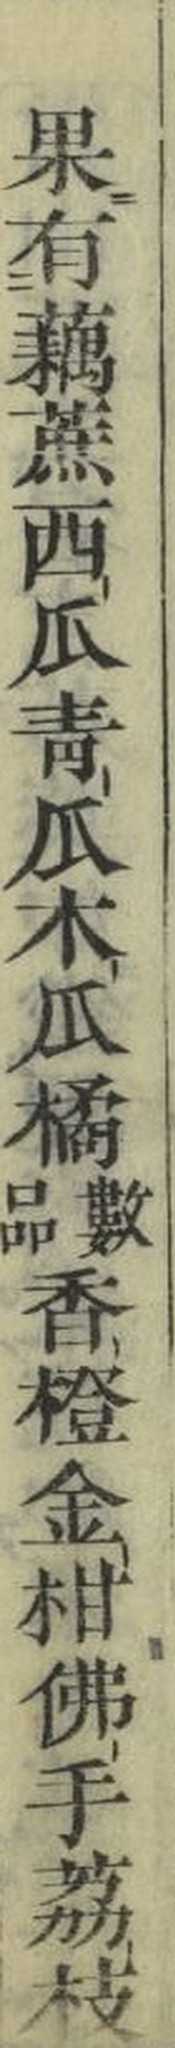果有藕蔗西-瓜青-瓜木-瓜橘数品香-橙金-柑仏-手茘-枝
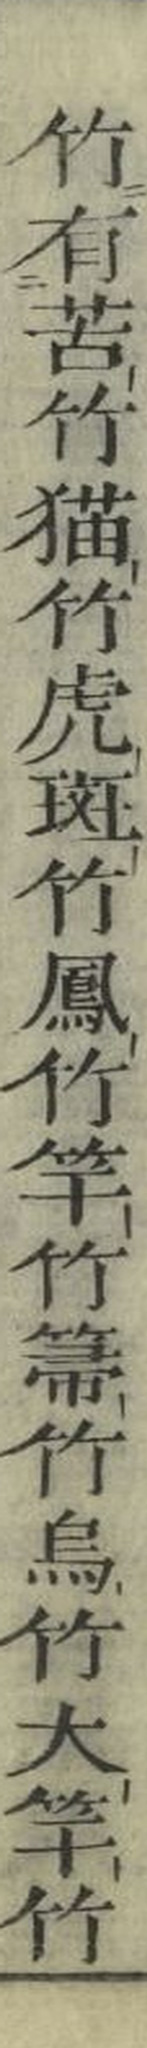竹有苦-竹猫-竹虎-斑-竹鳳-竹竿-竹箒-竹烏-竹大-竿-竹

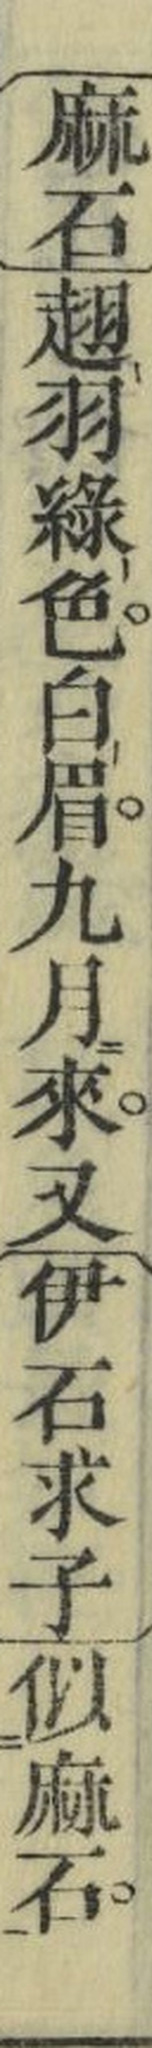[麻石]趐-羽緑-色。白-眉。九月来。又[伊石求子]似麻石。

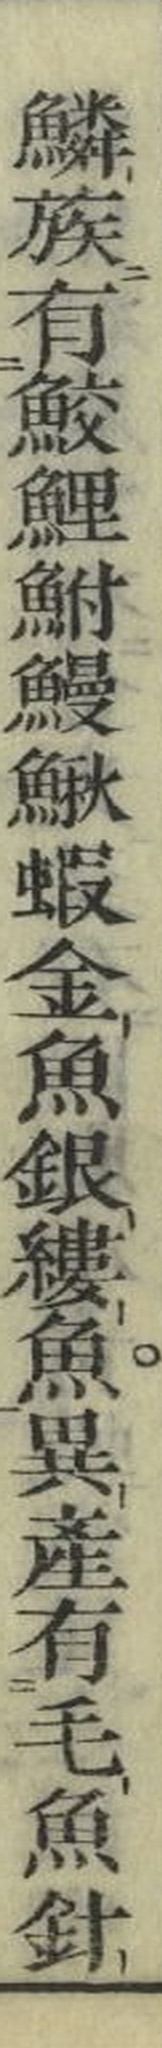鱗-族有鮫鯉鮒鰻鰍蝦金-魚銀-縷-魚。異-産有毛-魚針-
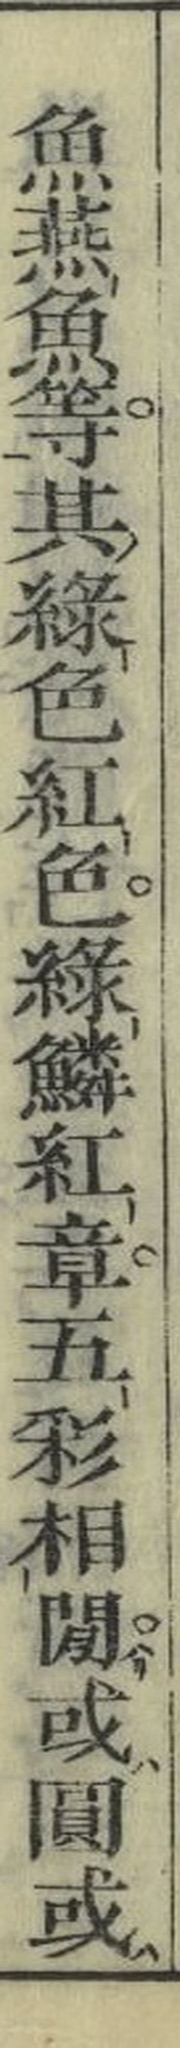魚燕-魚等。其緑-色紅-色。緑-鱗紅-章。五-彩相-間。或円或

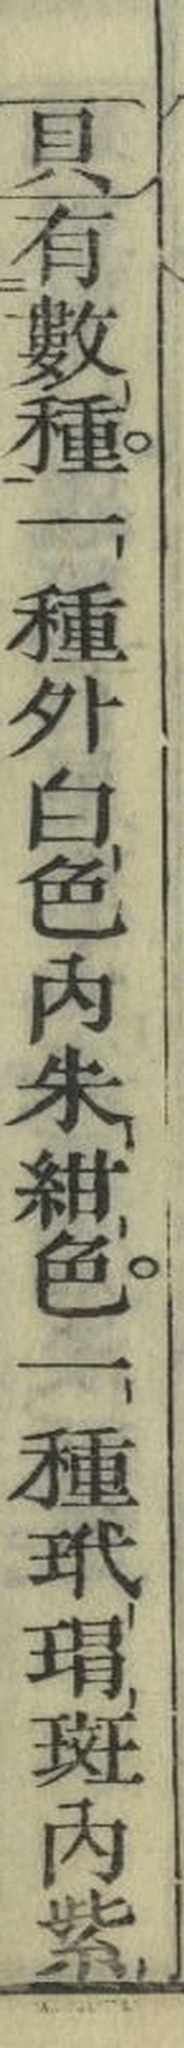[貝]有数-種。一-種外白-色内朱-紺-色。一-種玳-瑁-斑内紫-
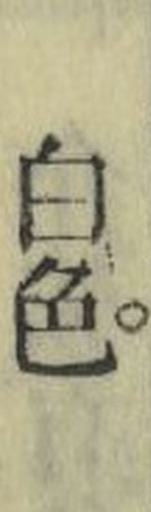白-色。
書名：中山伝信録 巻六
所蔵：University of the Ryukyus Library
